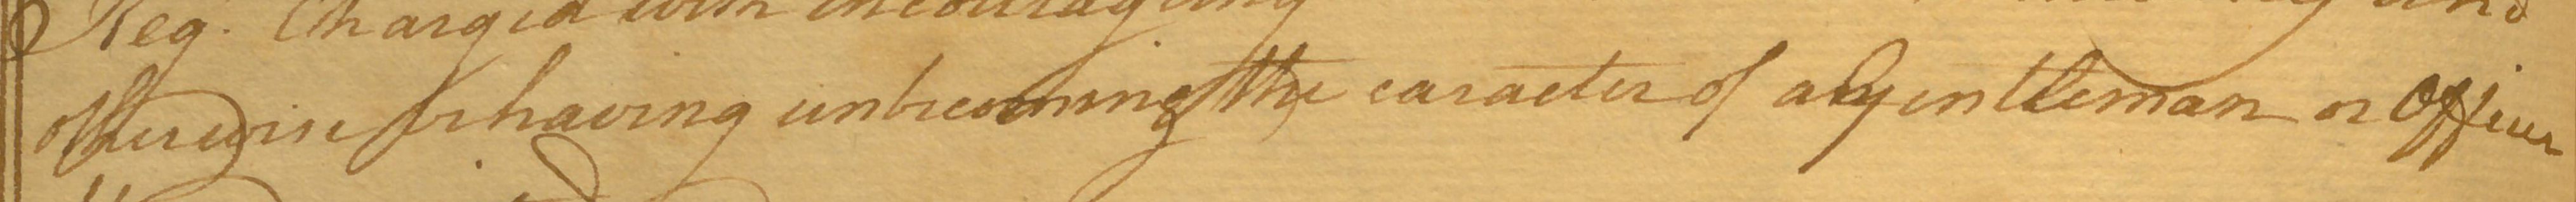otherwise behaving unbecoming the caracter of a Gentleman or Officer
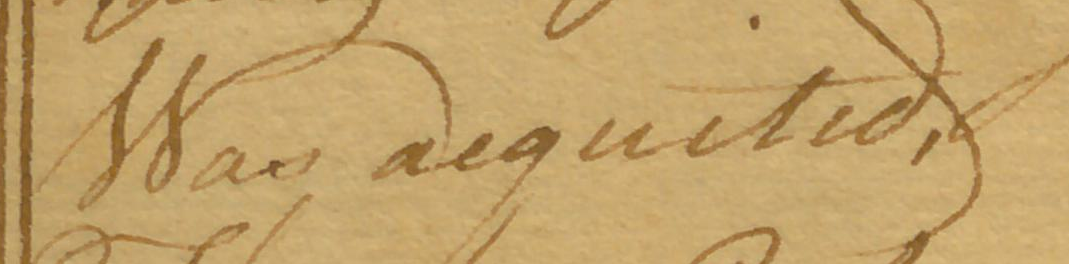Was acquited.
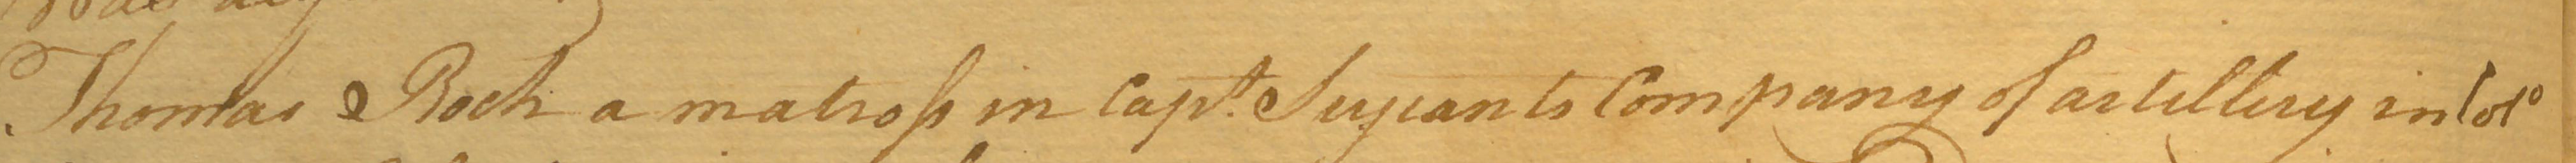Thomas Rock a matross in Cap^t. Serjeants Company of artillery in Col^o
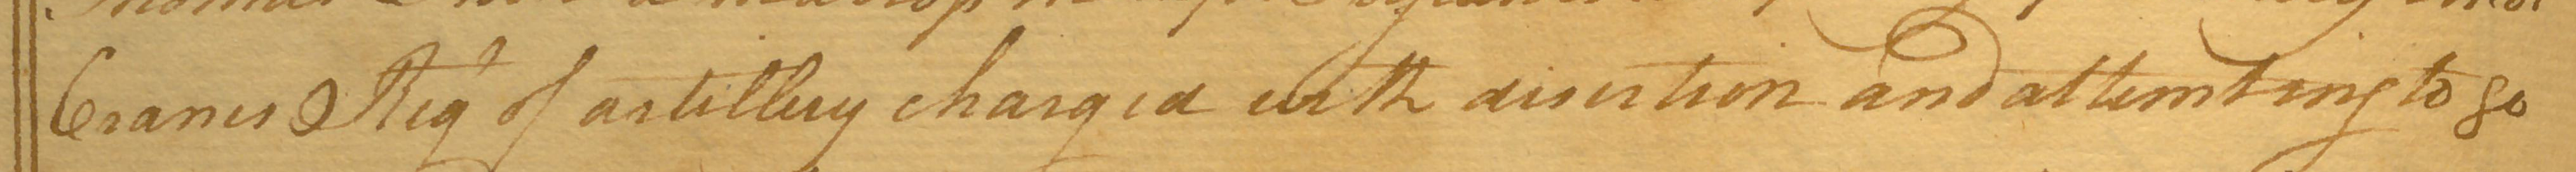Cranes Reg^t of artillery charged with disertion and attempting to go
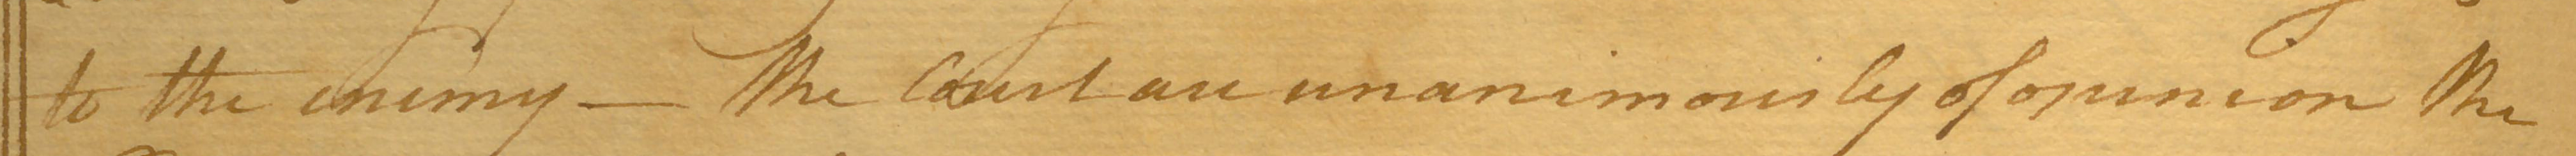to the enemy- The Court are unanimously of opinion the
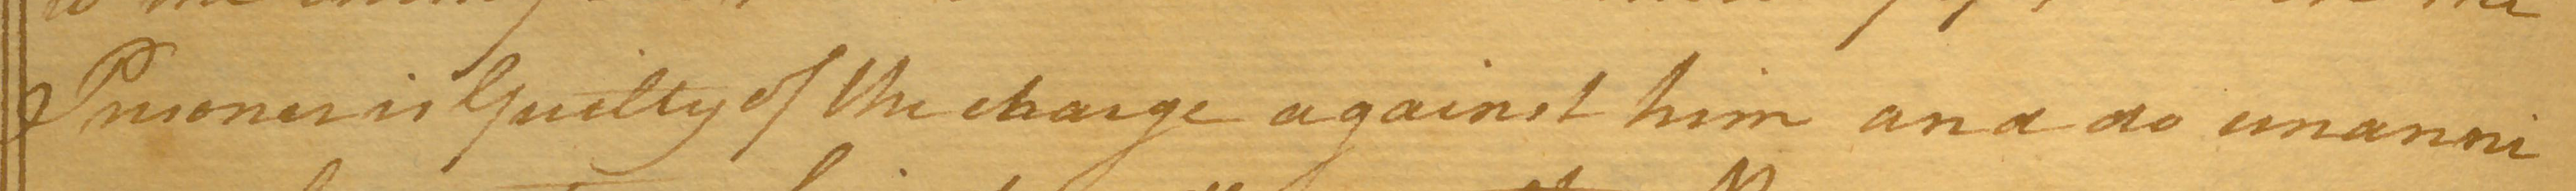Prisoner is Guilty of the charge against him and do unani
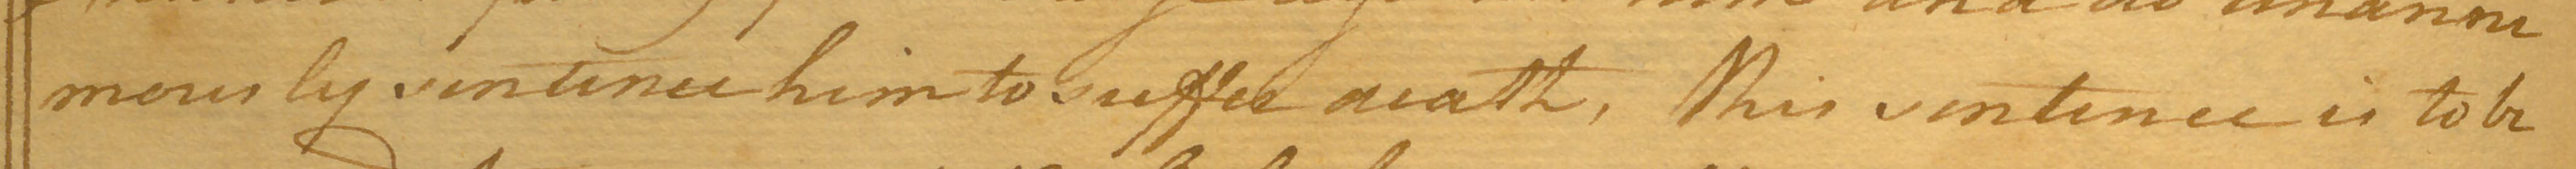mously sentence him to suffer death. This sentence is to be
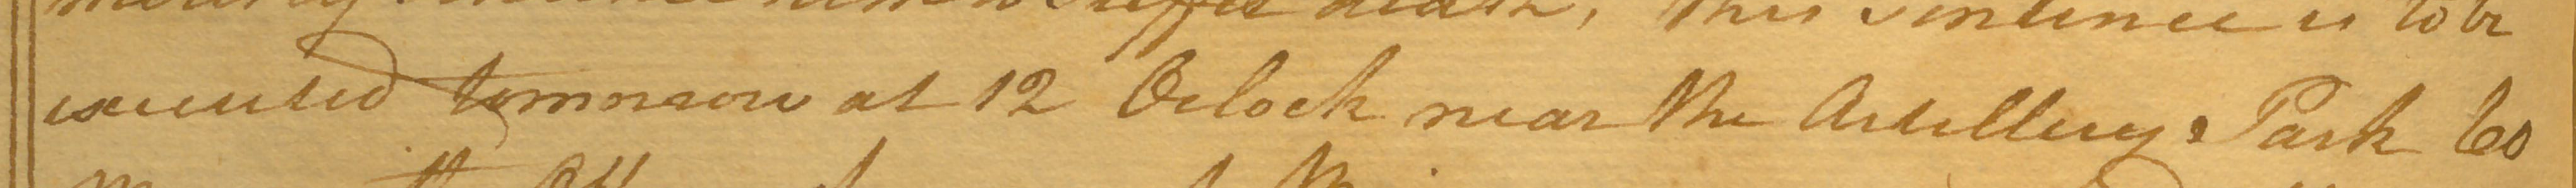issued tomorrow at 12 Oclock near the Artillery Park 60
